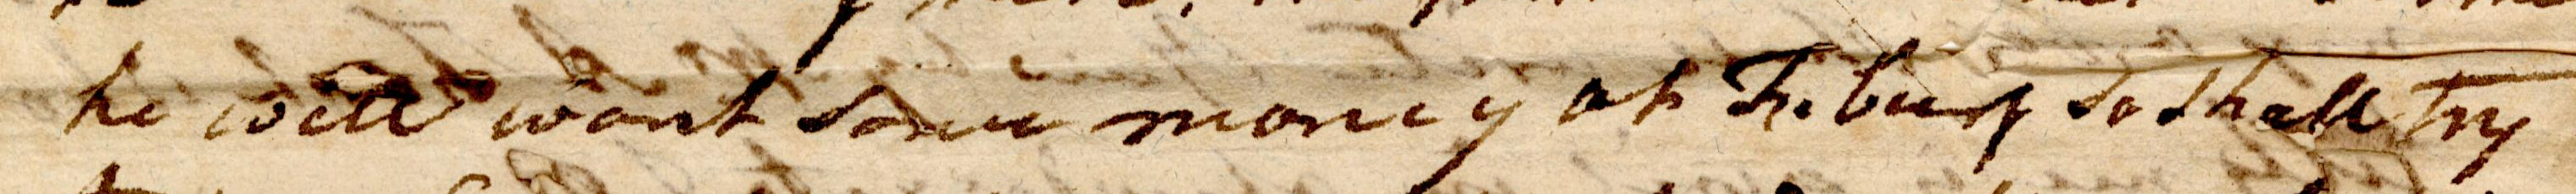he will want some money at F.burg so shall try
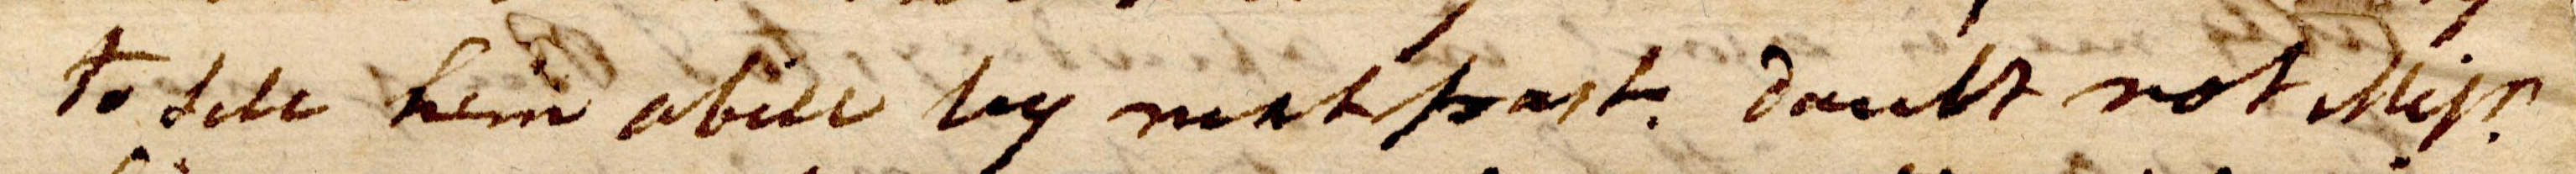to sell him a bill by next post doubt not Mes^r.
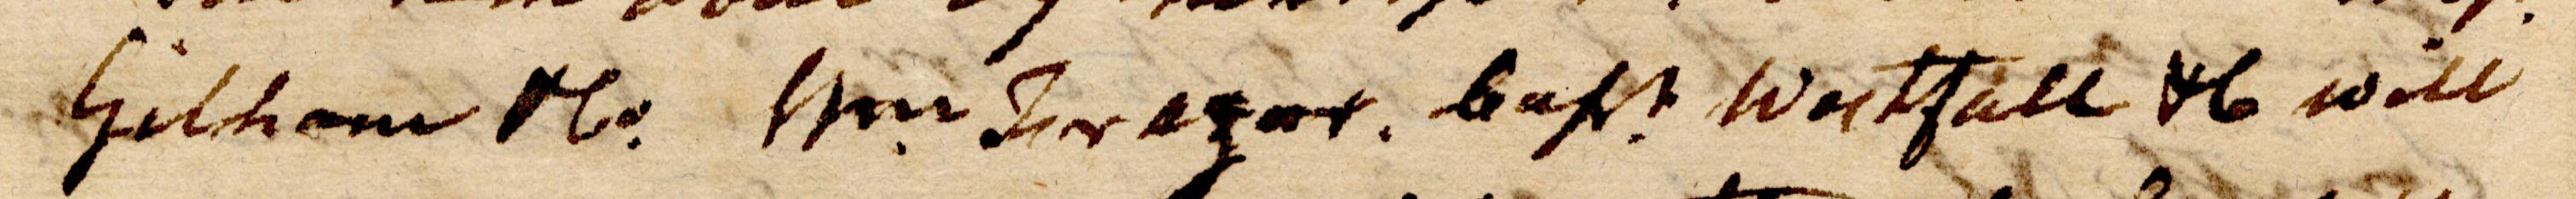Gilham &Co. W^m Frogart. Cap^t. Westfall &C will
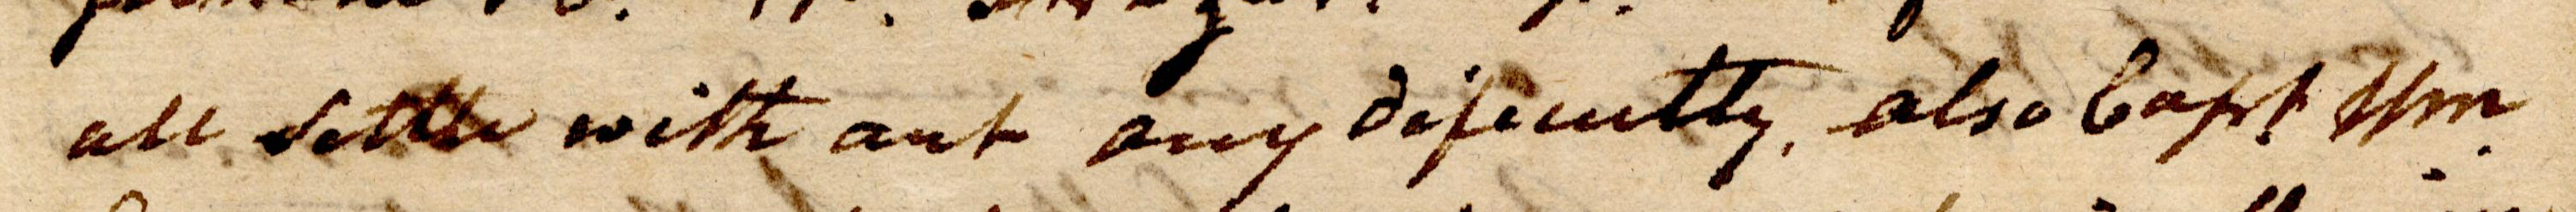all settle with out any deficulty also Capt Wm
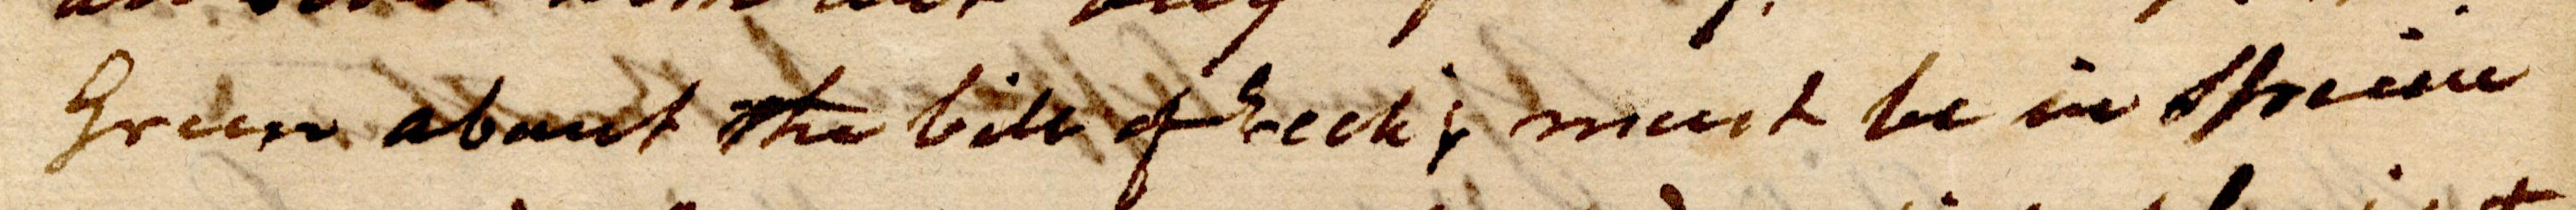Green about the bill of Exchg must be in price
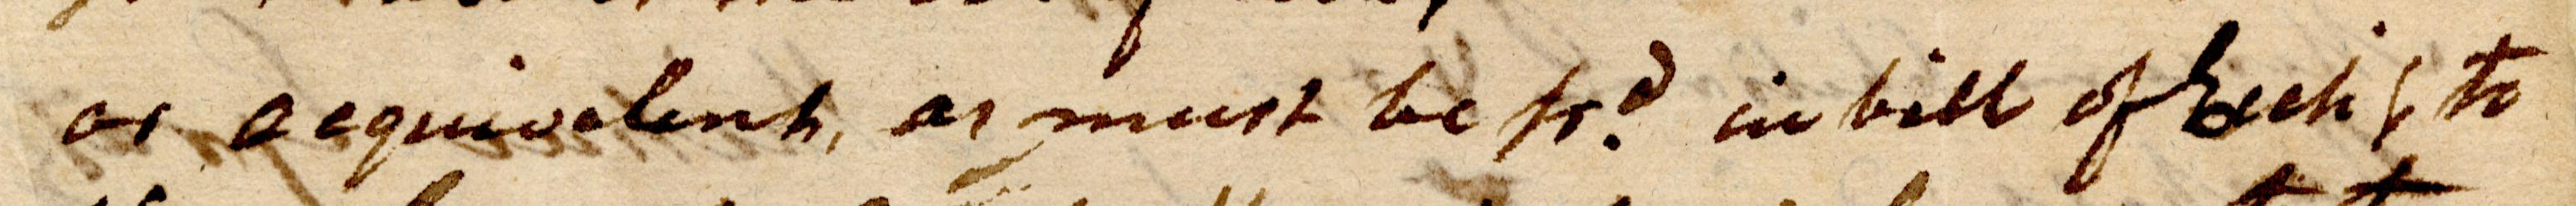as aequivalent, as must be p^d. in bill of Exchg to
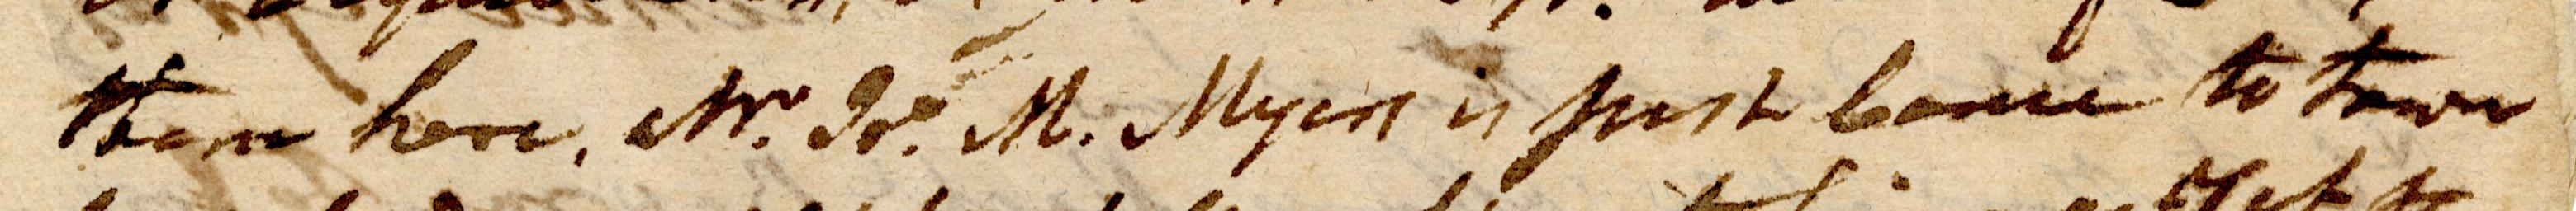them here, M^r. So^n. M. Myers is just come to town
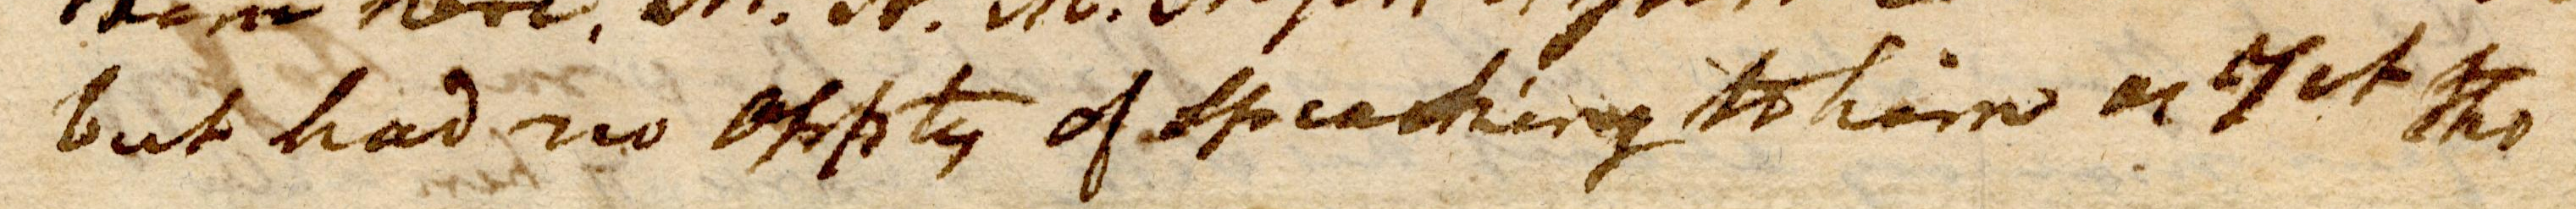but had no Op^ty of speaking to him as yet tho
